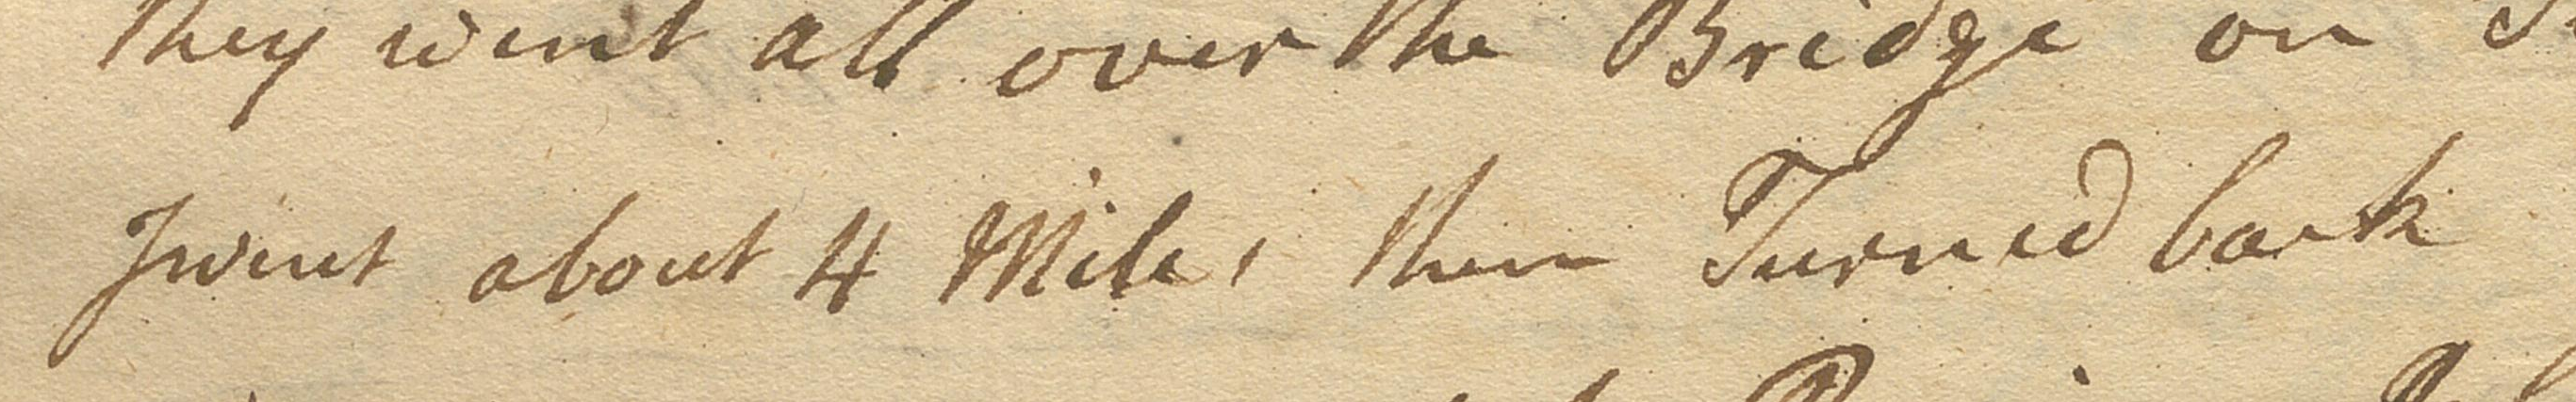I went about 4 Miles then Turned back
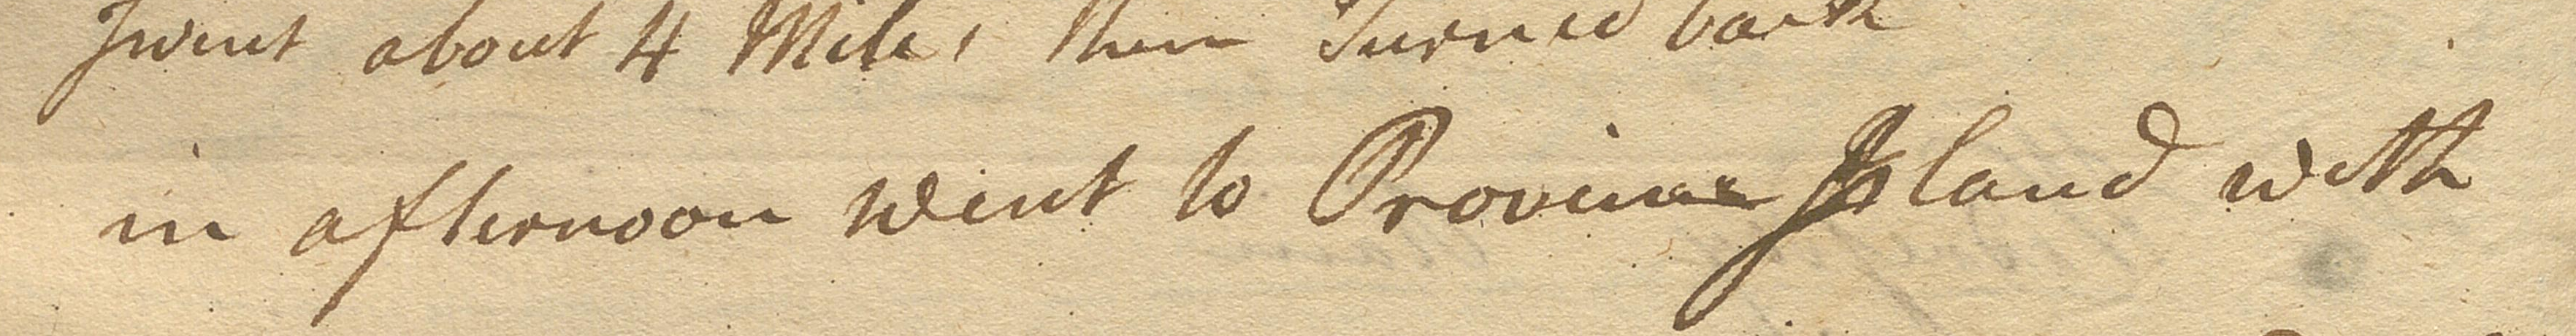in afternoon went to Province Island with
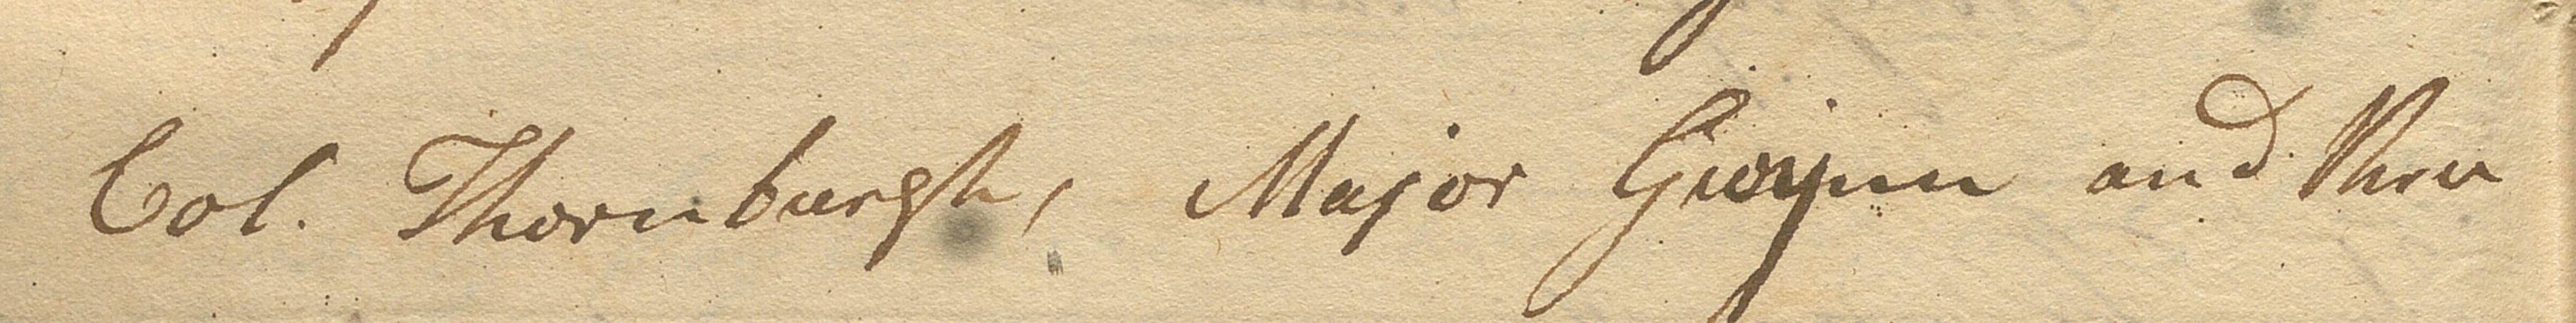Col. Thornburgh, Major Geojin and three
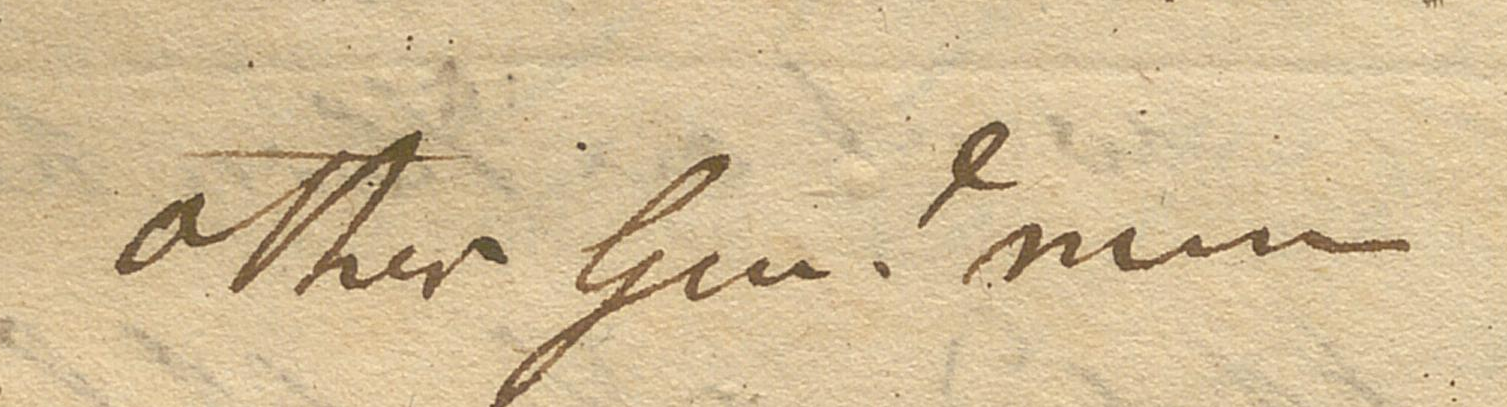other Gen^l.men
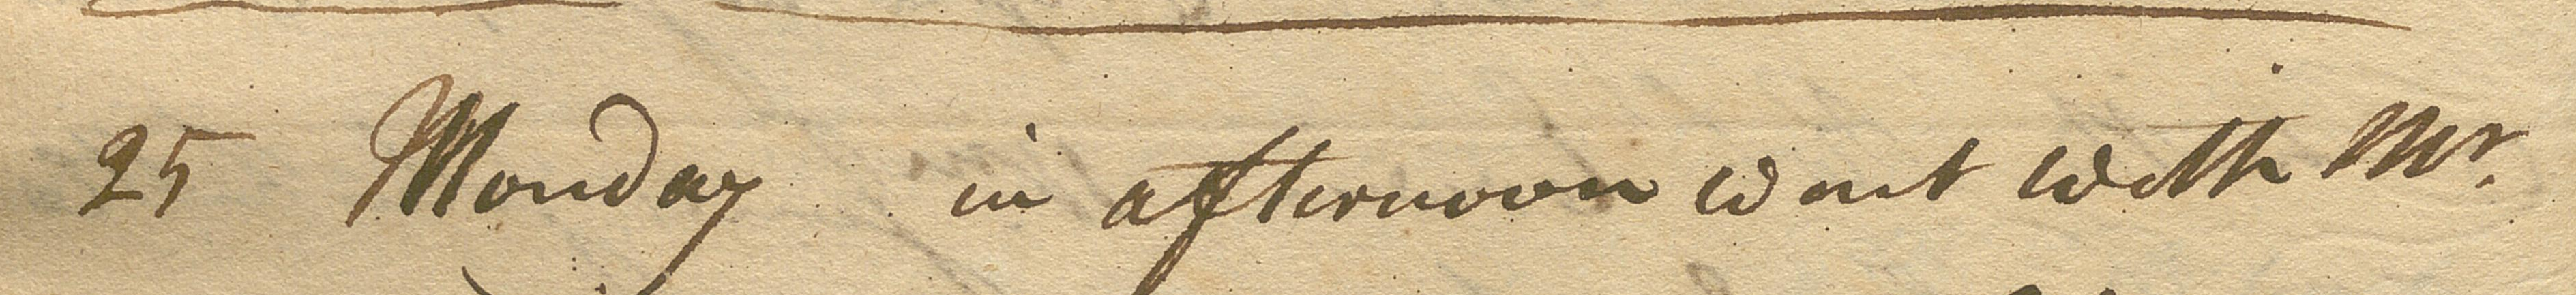25 Monday in afternoon went with M^r.
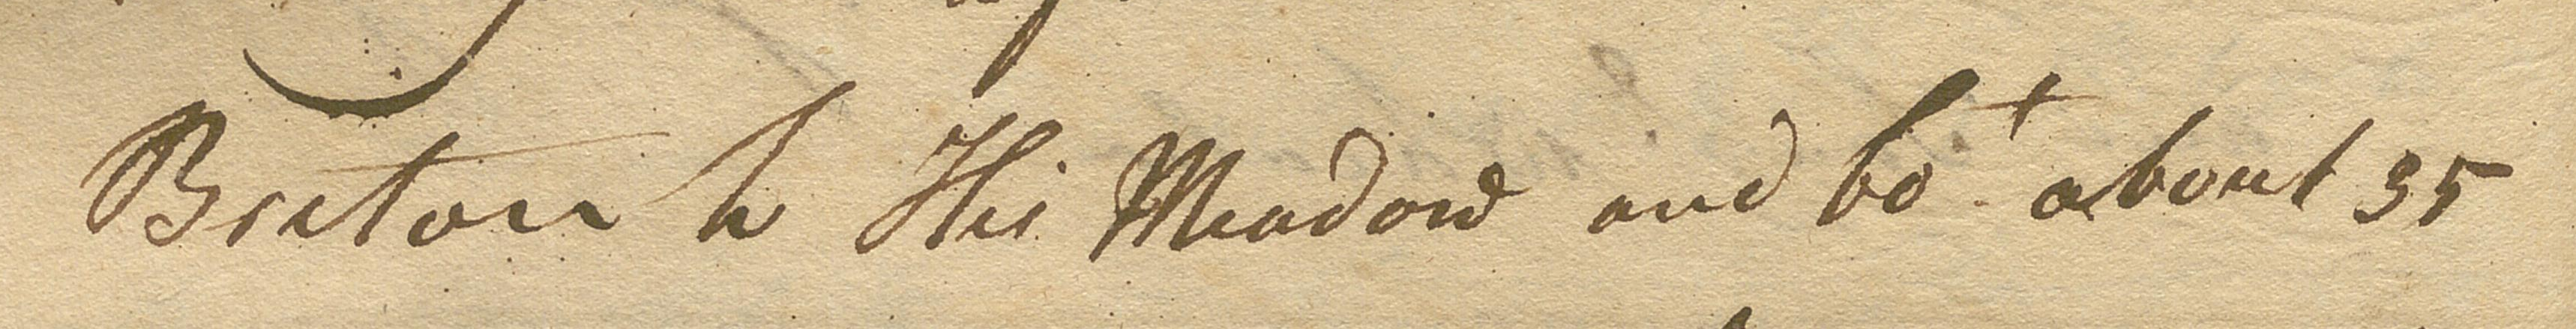Breton to His Meadow and bo^t about 35
